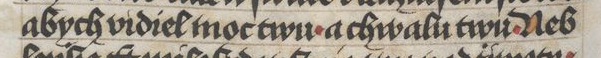abych vidiel moc twu.a chwalu twu.Neb
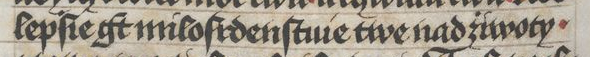lepẛie ḡt miloſrdenſtuíe twe nad żiwoty.
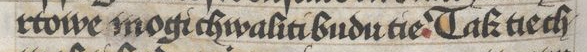rtowe mogi chwaliti budu tie.Tak tie ch¬
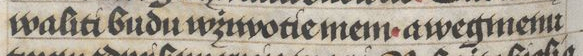waliti budu wżiwotie mem.a wegmenu
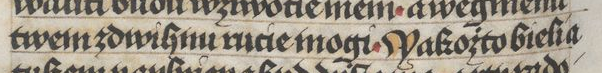twem zdwihnu rucie mogi.Yakożto bielí a
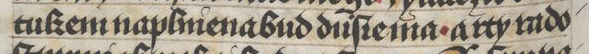tukem naplniena bud duẛie ma.a rty rado¬
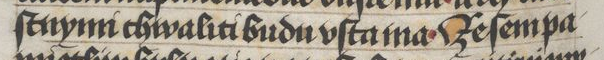ſtnymi chwaliti budu vſta ma.Ze ſem pa¬
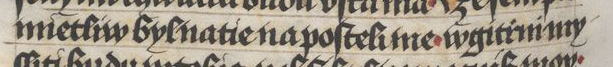mietliw byl natie na poſteli me.wgitṙni my¬
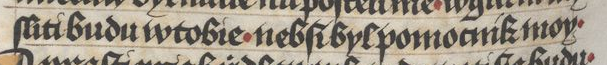ſliti budu w tobie.nebſi byl pomocník moy.
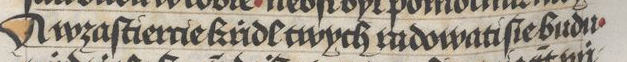A wzaſtiercie kṙidl twych radowatiſie budu.
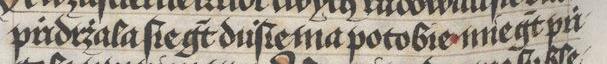pṙidrżala ſie ḡt duẛie ma potobie.mie ḡt pṙi¬
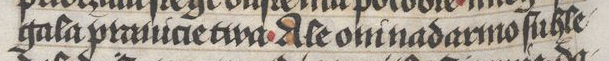gala prauicie twa.Ale oni nadarmo ſu hle¬
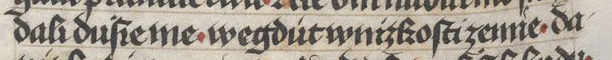dali duẛie me.wegdút wnízkoſti zemie.da¬
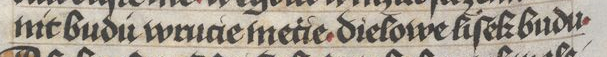nít budú wrucie meċie.dielowe liſek budu.
